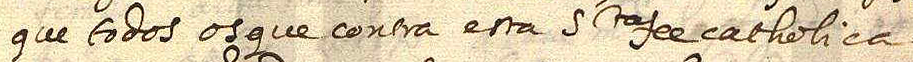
que todos os que contra esta sta fee catholica,
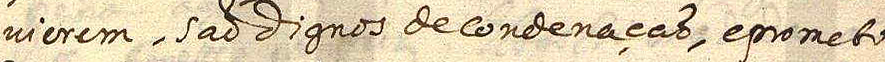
uierem, saõ dignos de condenaçaõ, e prometo
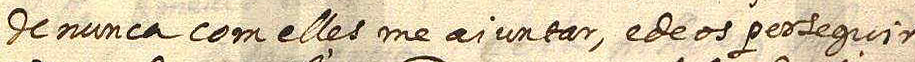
de nunca com elles me aiuntar, e de os perseguir
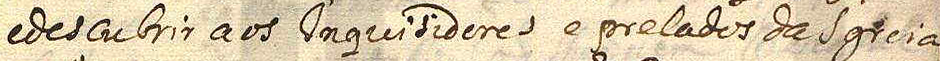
e descubrir aos Inquisidores e prelados da Igreia
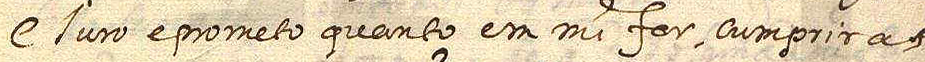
e Iuro e prometo quanto em mī for, cumprir as
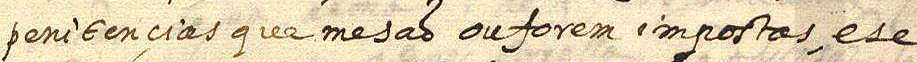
penitencias que me saõ ou forem impostas, e se
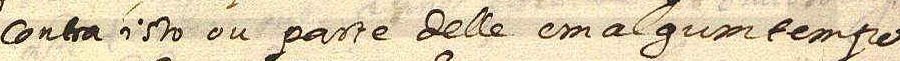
contra isto ou parte delle em algum tempo
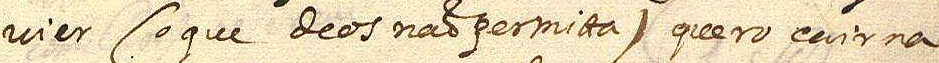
uier (o que deos naõ permita) quero cair na
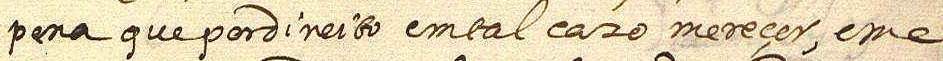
pena que per direito em tal cazo merecer, e me
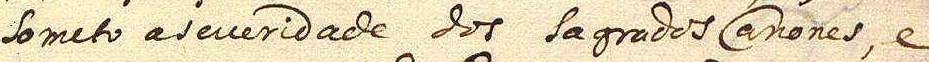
someto a seueridade dos sagrados Canones, e
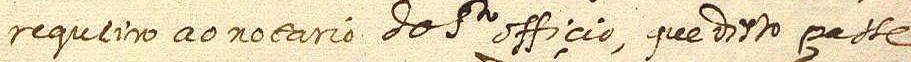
requeiro ao notario do sto officio, que disto passe
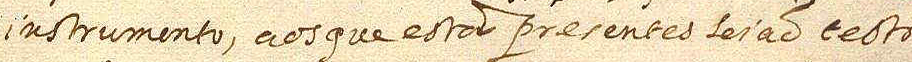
instrumento, aos que estaõ presentes seiaõ teste
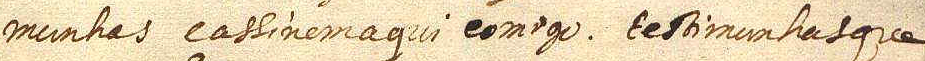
munhas e assinem aqui comigo. testimunhas que
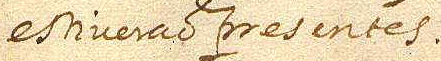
estiueraõ presentes.
